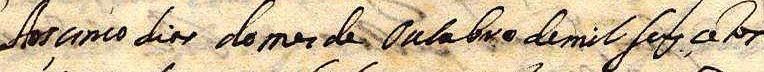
Aos çinco dias do mes de Outubro de mil seisçētos
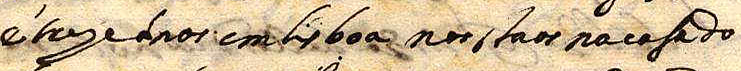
e treze dias em lisboa nos staos na casa do
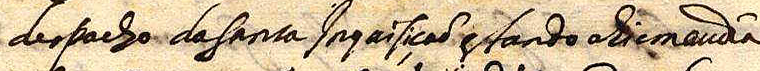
despacho da santa Jnquisiçaõ estando ahi em audiā
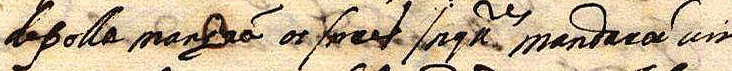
de polla manhaã os snres̄ Jnqu.res mandarā uir
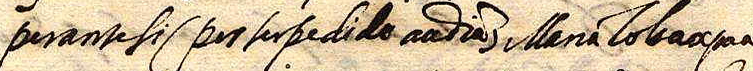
perante si (por ter pedido audiā, Maria Loba xpaã
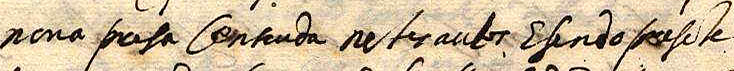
noua presa Conteuda nestes autos, E sendo presēte
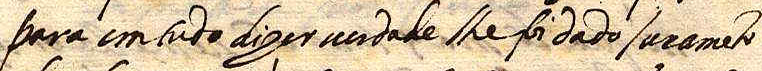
para em tudo dizer uerdade lhe foi dado Juramēto
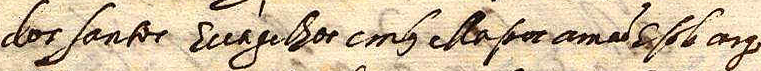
dos Santos Euāgelhos em q̄ ella pos a maõ E sob cargo
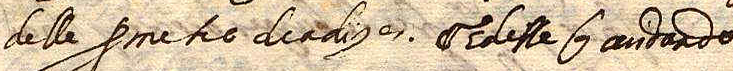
delle ꝓmeteo de a dizer. ⁋ E disse q̄ andando
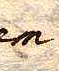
em
